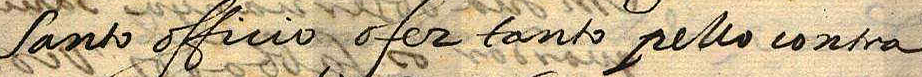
Santo officio o fez tanto pello contra
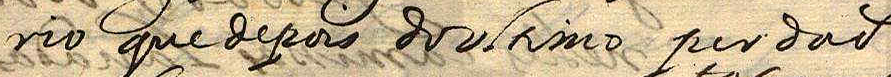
rio que depois do vltimo perdaõ
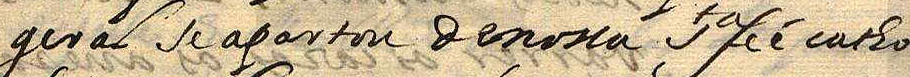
geral se apartou de nossa sta feé catho
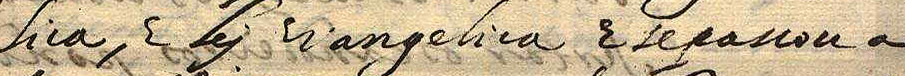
lica, E lej Evangelica E se passou a
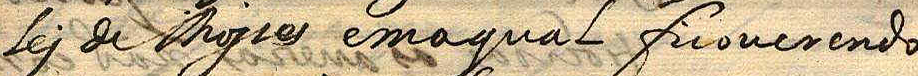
lej de Mojses em a quaL ficou crendo
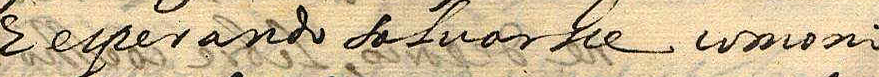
E esperando saluar sse comoni
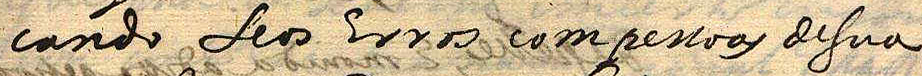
cando seos Erros com pessoas de sua
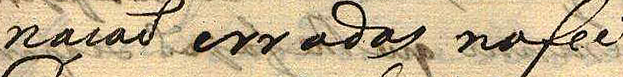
naçaõ erradas na feé
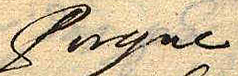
Porque
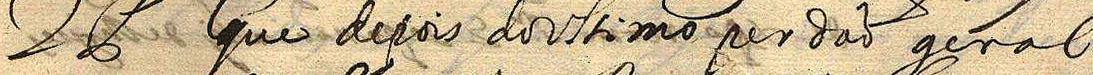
2 P Que depois do vltimo perdaõ geral
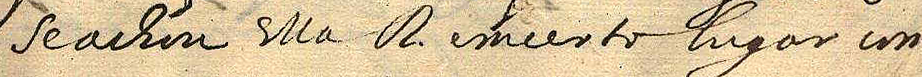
se achou Ella R. em certo lugar con
